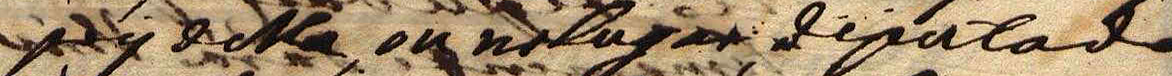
pois della, ou no lugar deputado
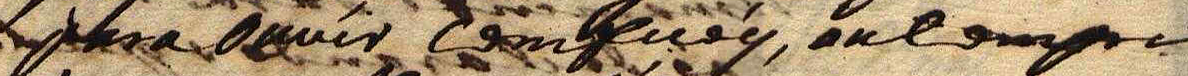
para ouuir comfições, ou com pre
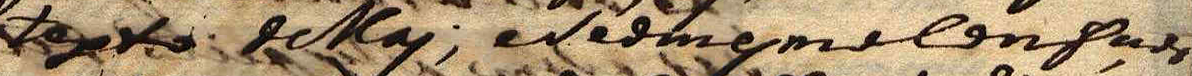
texto dellas; e se o mesmo confeçor
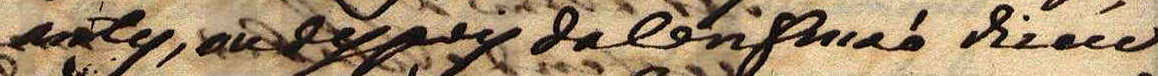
antes, ou despois da confissaõ disece
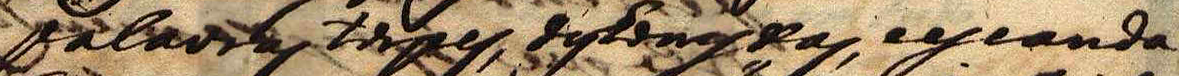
palavras torpes, deshonestas, e escanda
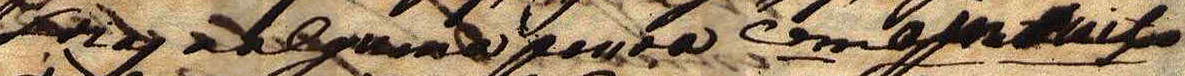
lozas a alguma pessoa com o jntuito
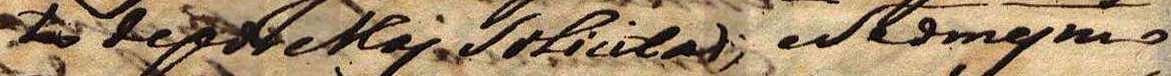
to de por ellas solicitar; se o mesmo
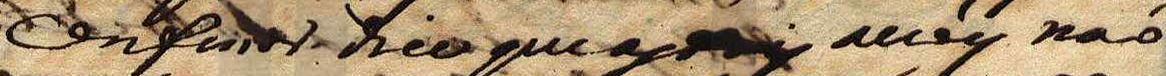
confessor dice que as tais acções naõ
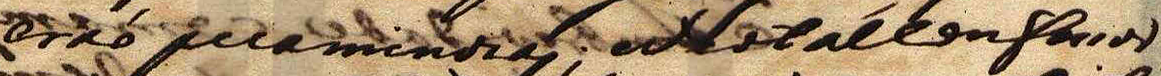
eraõ pecaminosas; e se o tal confessor
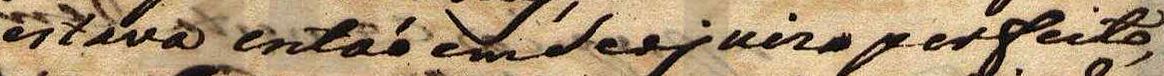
estava entaõ em seo juizo perfeito,
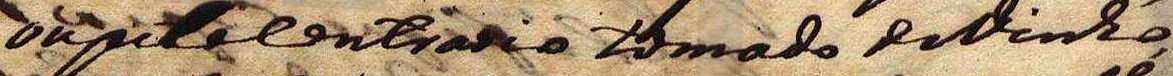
ou pelo contrario tomado de vinho
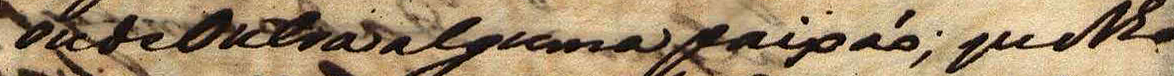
ou de Outra alguma paixaõ; que lho
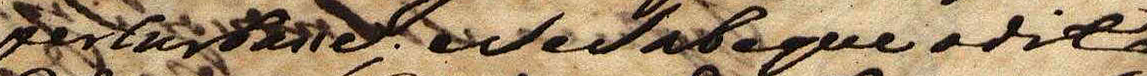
perturbasse; e se sabe que o dito
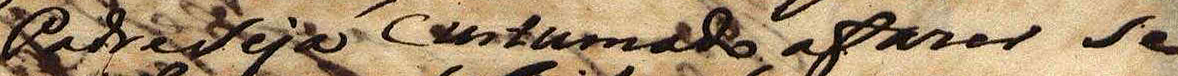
Padre seja custumado a fazer se
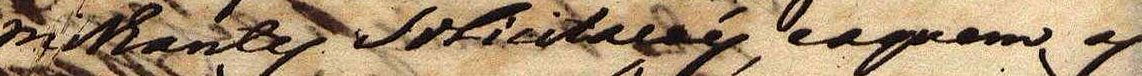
milhantes solicitações, e a quem as
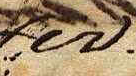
fez.
